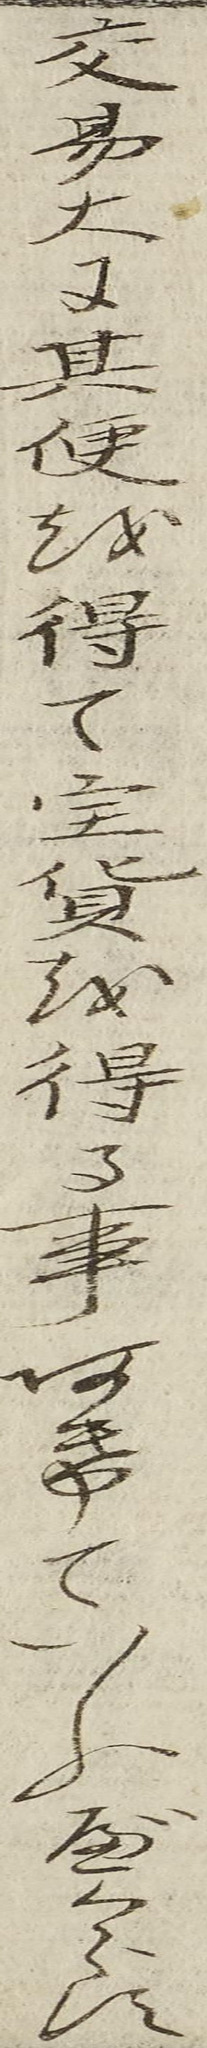交易大に其便を得て宝貨を得る事あけていふべからす

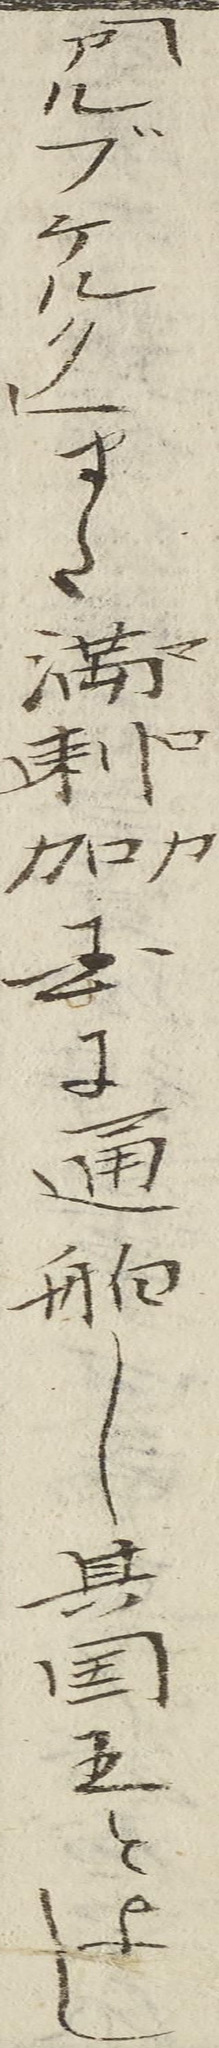「アルブケルク」また満刺加国に通舶し其国主とよし
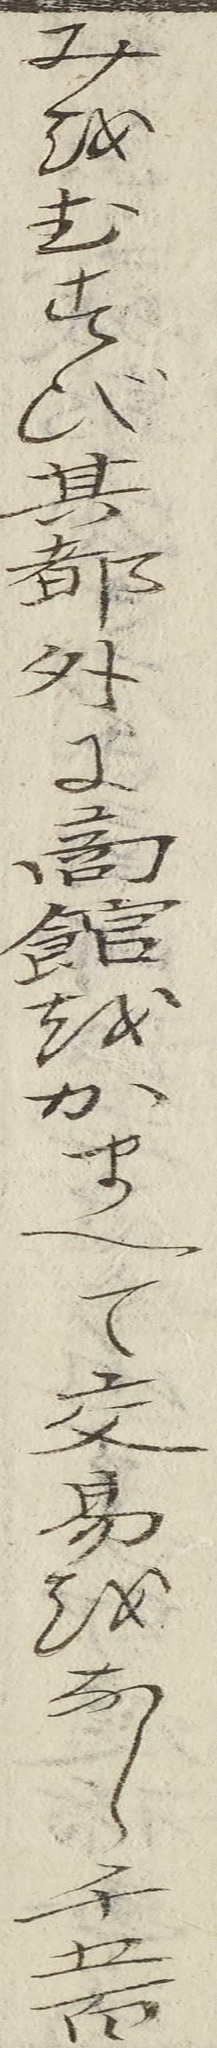みをむすび其の都外に商館をかまへて交易をなし千五百
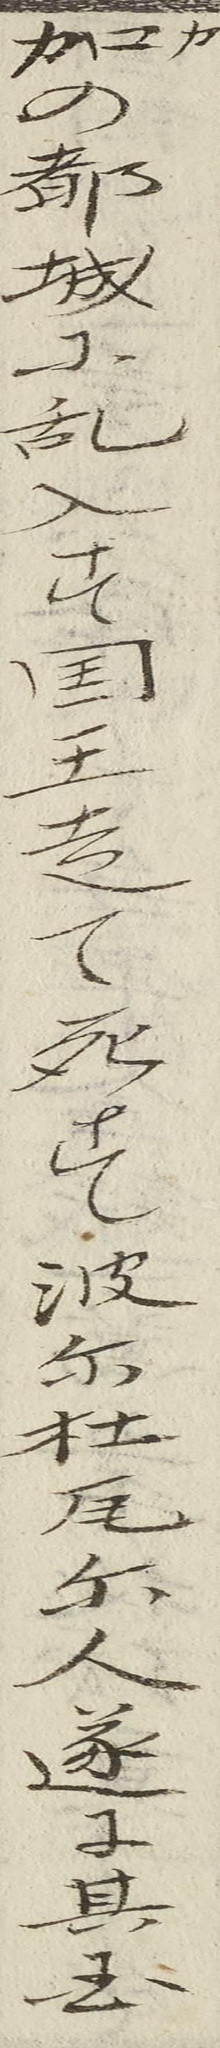加の都城に乱入す国王は走て死す波尓杜亙尓人遂に其国
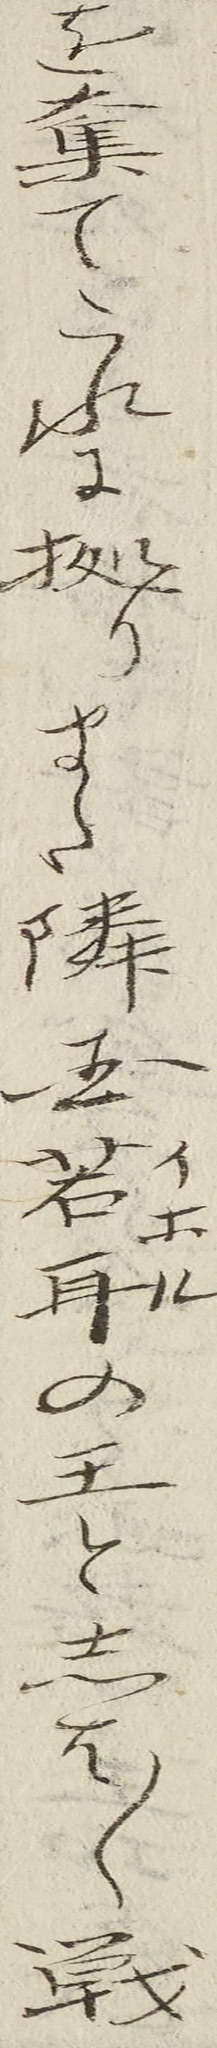を奪てこれに拠りまた隣国若耳の王としは〳〵戦
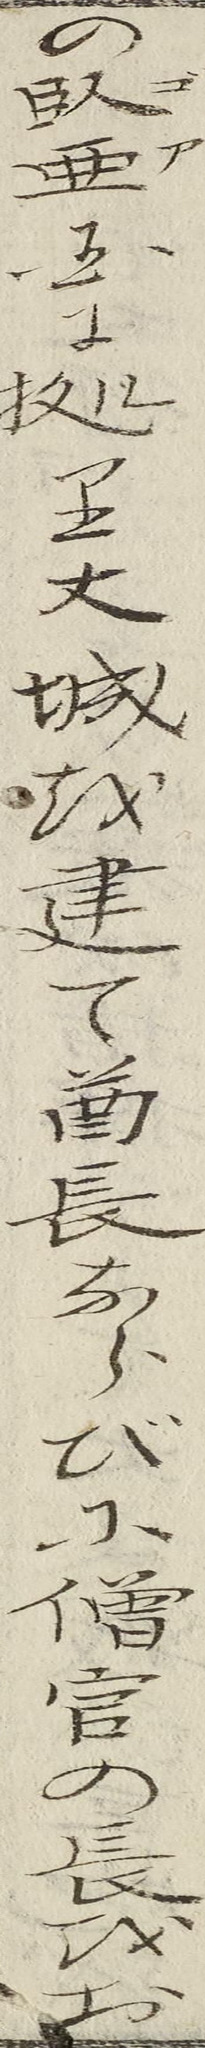の臥亜国に拠り大城を建て酋長ならびに僧官の長をお
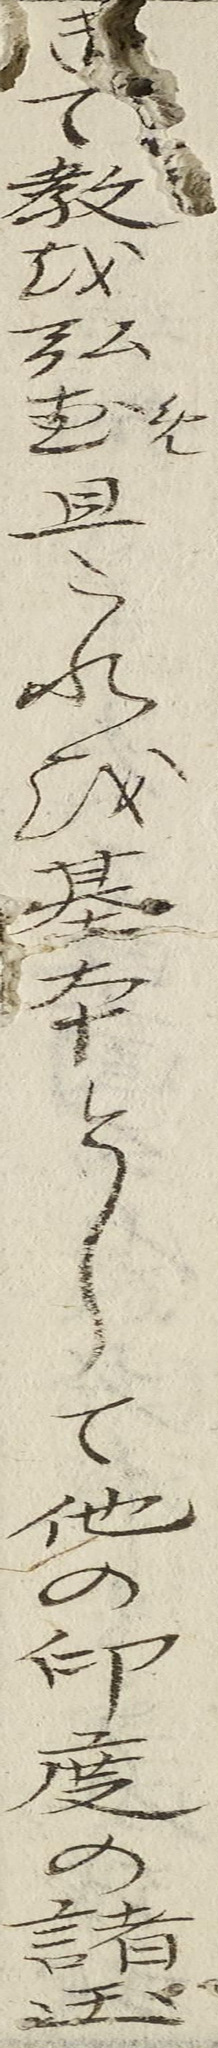きて教を弘め且これを基本として他の印度の諸王
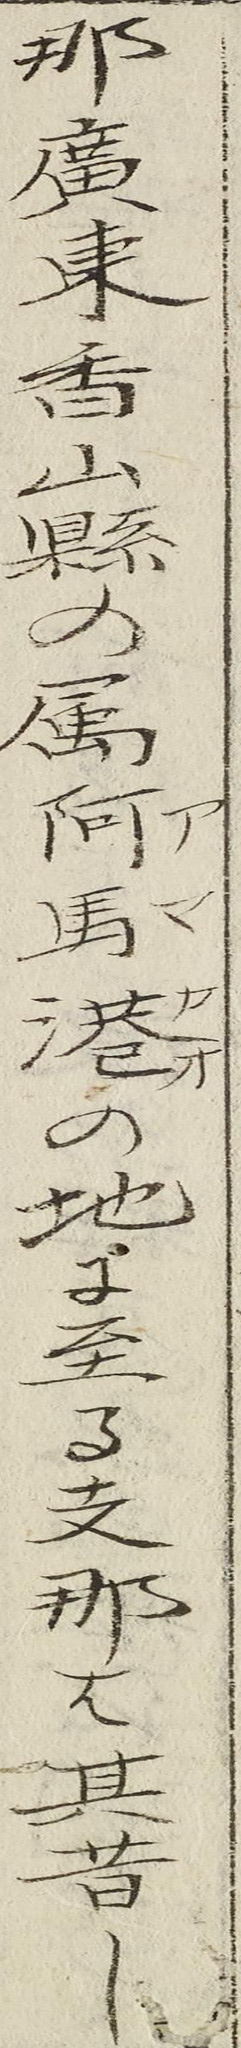那広東香山県の属阿馬港の地に至る支那は其昔し
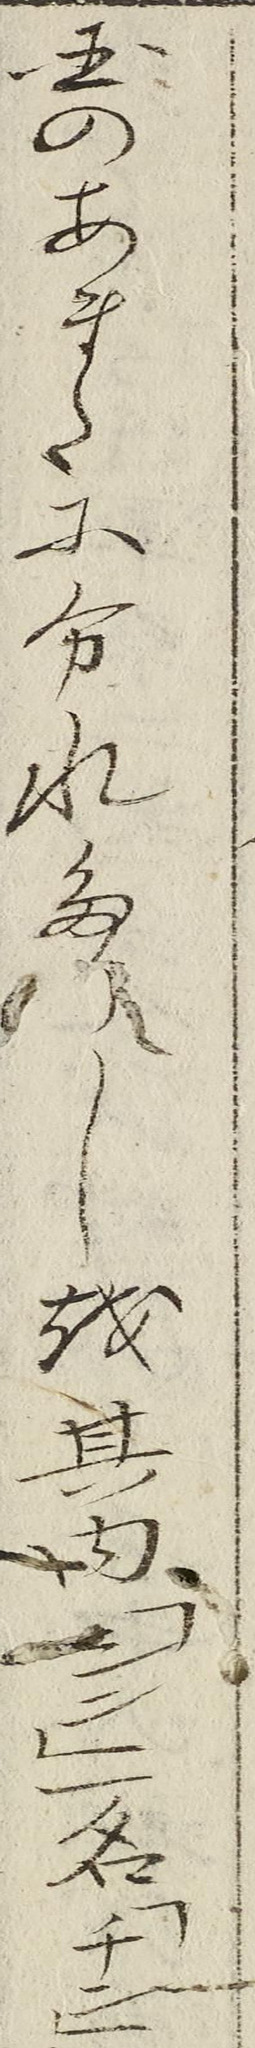王のあまたに分れたりしを其内「シン」一名「チン」すなはち秦なり
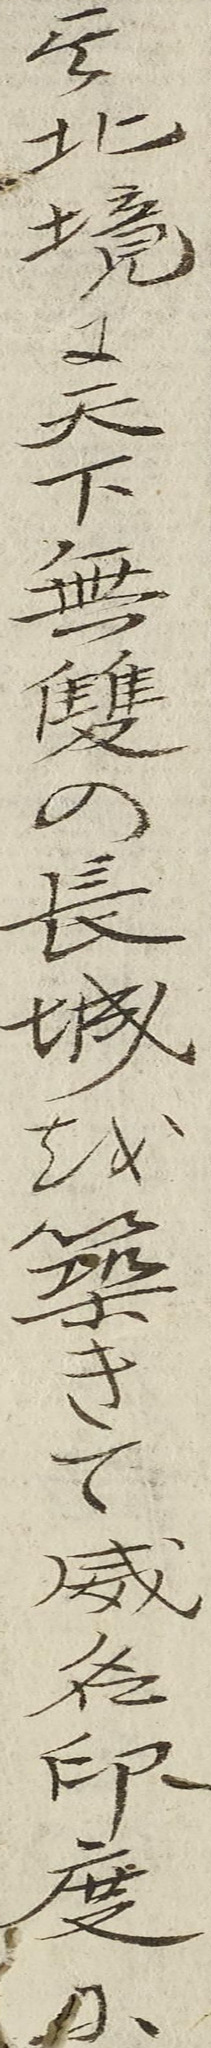其北境に天下無双の長城を築きて威名印度に
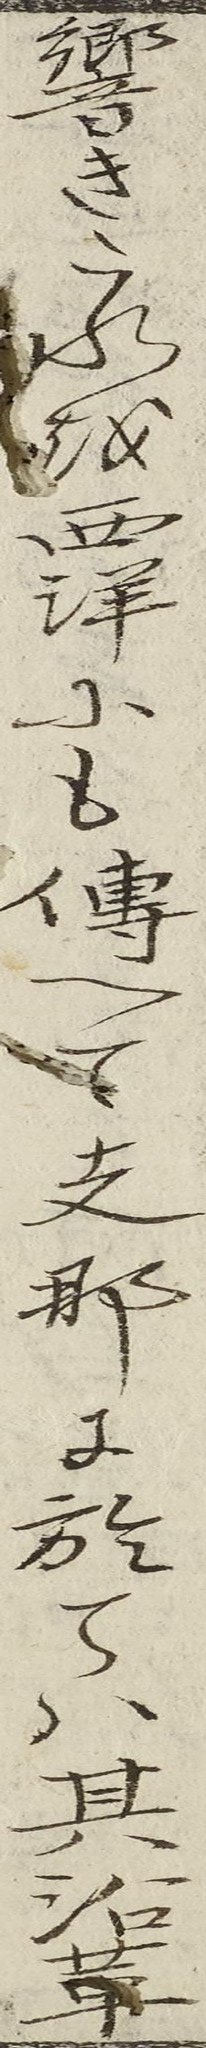響きこれを西洋にも伝へて支那に於てハ其沿革
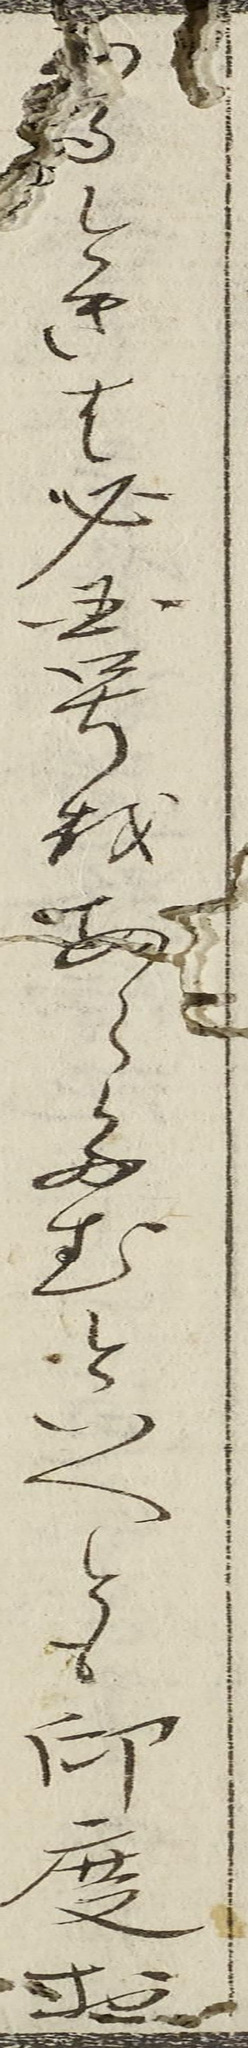あるしれは必国号をあらたむといへとも印度お
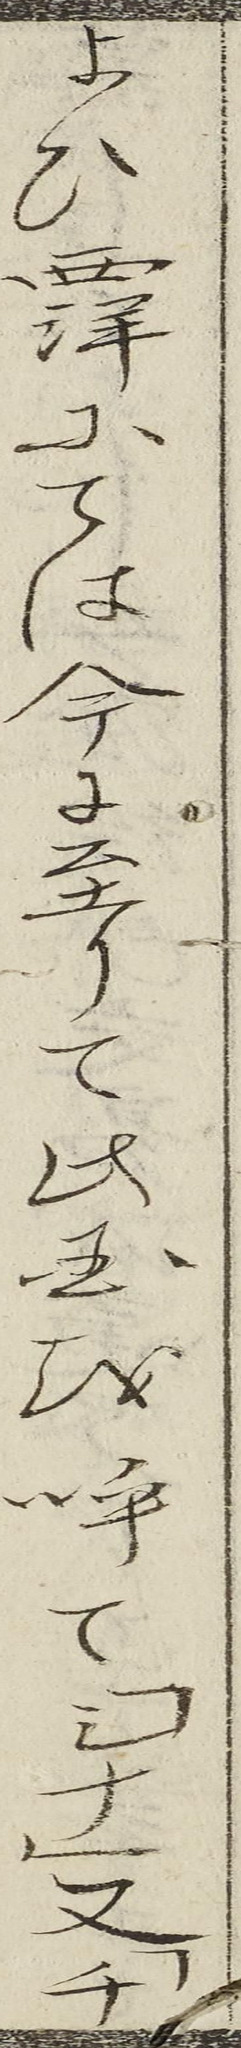よひ西洋にてハ今に至り」て此国を呼て「シナ」又「チ
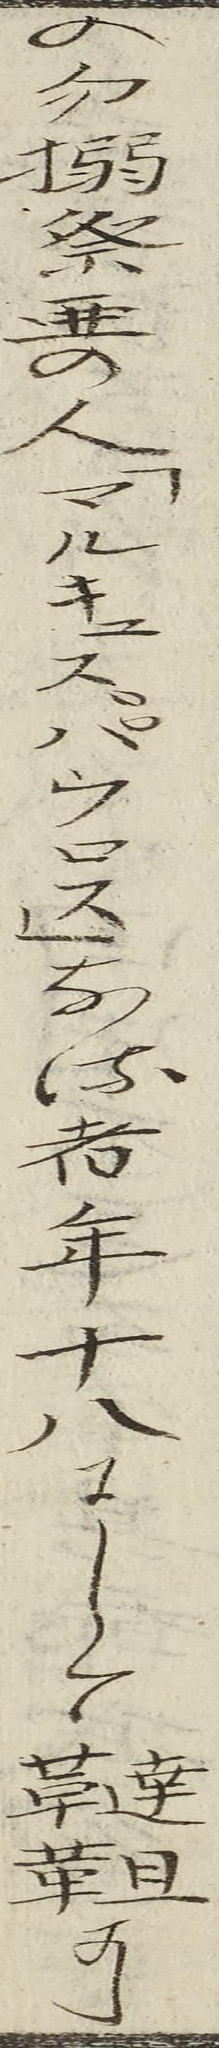の尓搦祭亜の人「マルキュス。パウロス」なる者年十八にして韃靼に
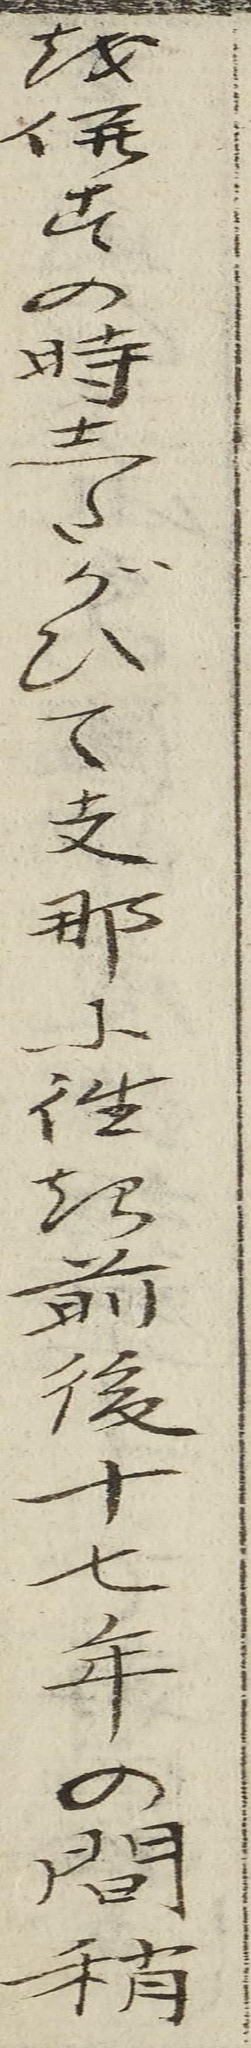を併すの時したがひて支那に往き前後十七年の間稍

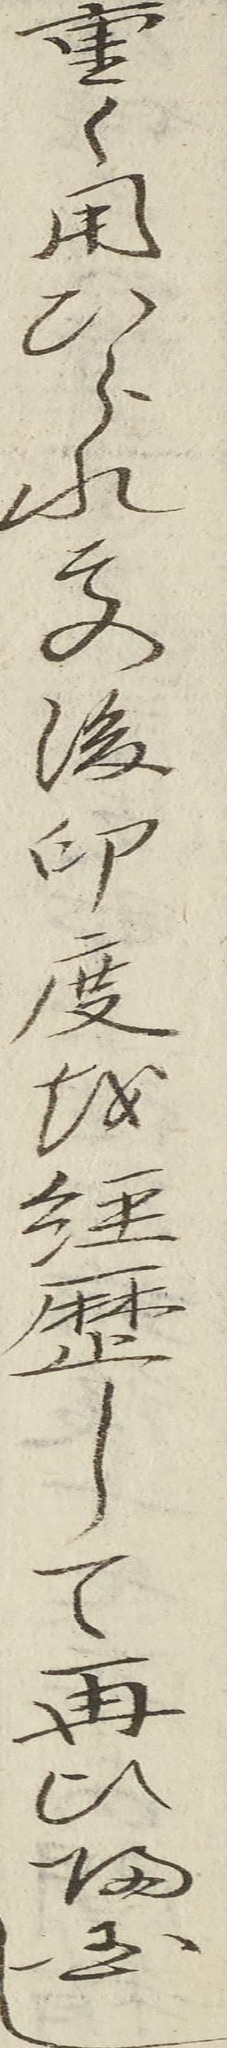重く用ひられその後印度を経歴して再ひ帰国し
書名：西洋雜記　乾
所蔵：東京大学地震研究所図書室 Earthquake Research Institute Library, The University of Tokyo, JAPAN
